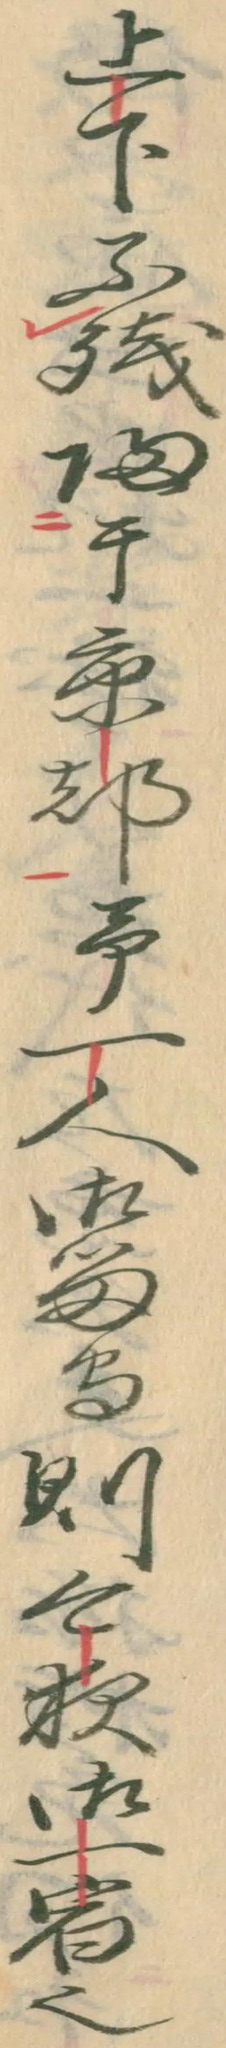上-下不残帰于京-都予一-人御留守則今-夜御-一-宿也

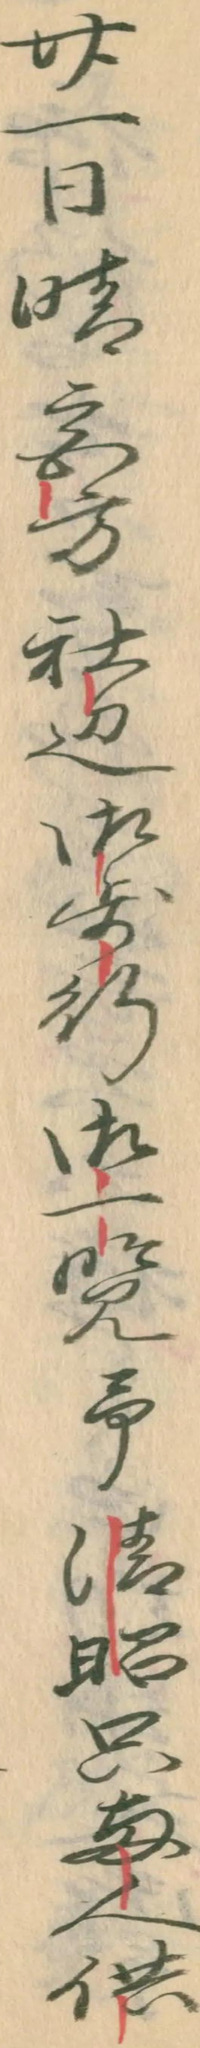廿一日晴宮_方社-辺御-歩-行御-一-覧予清昭只両-人供-
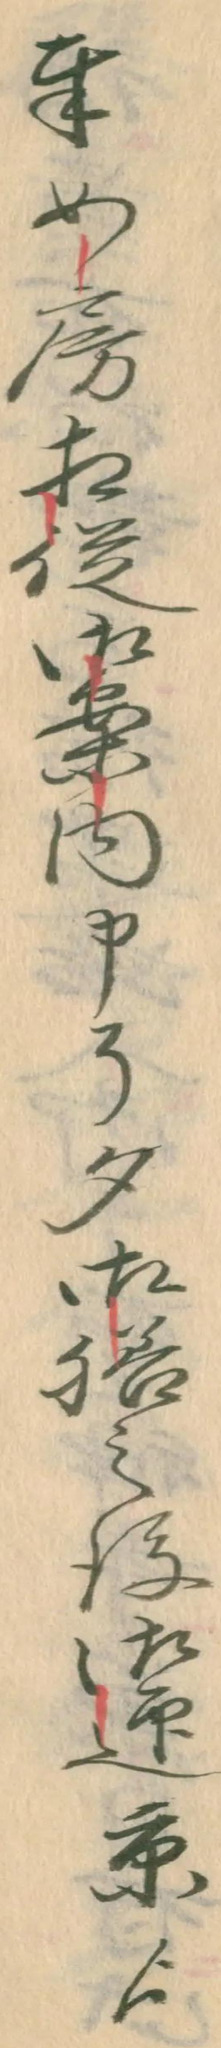奉女-房相_従御-案-内申了夕御-膳之後御_迎京ゟ
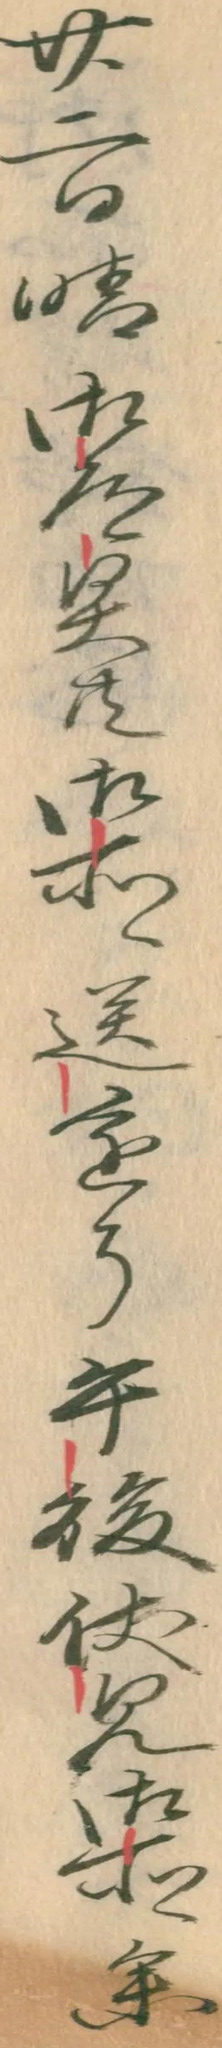廿二日晴御-道-具共御-所へ送_進了午_後伏_見御-所へ参
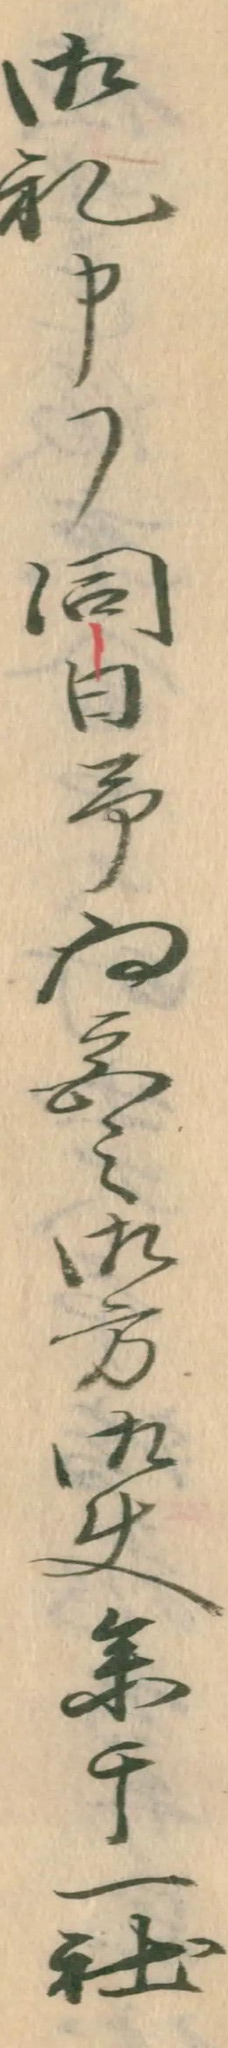御礼申コト同-日予為宮之御方御使参于一社
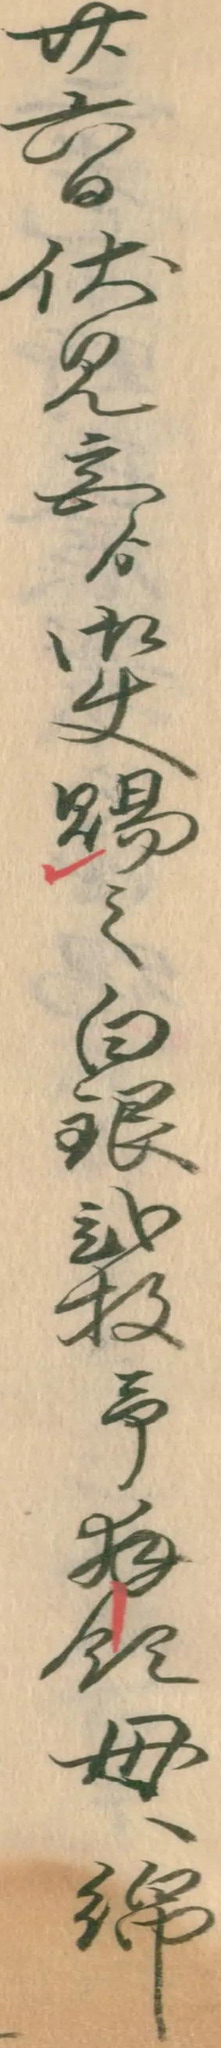廿六日伏見宮ゟ御使賜之白銀弐枚予拝-領母へ綿
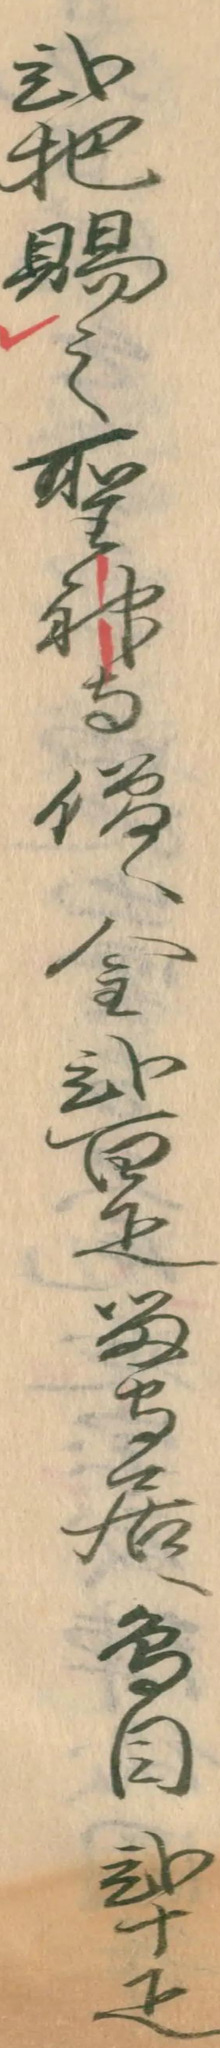弐把賜之聖-神-寺僧へ金弐百疋留守居へ鳥目弐十疋
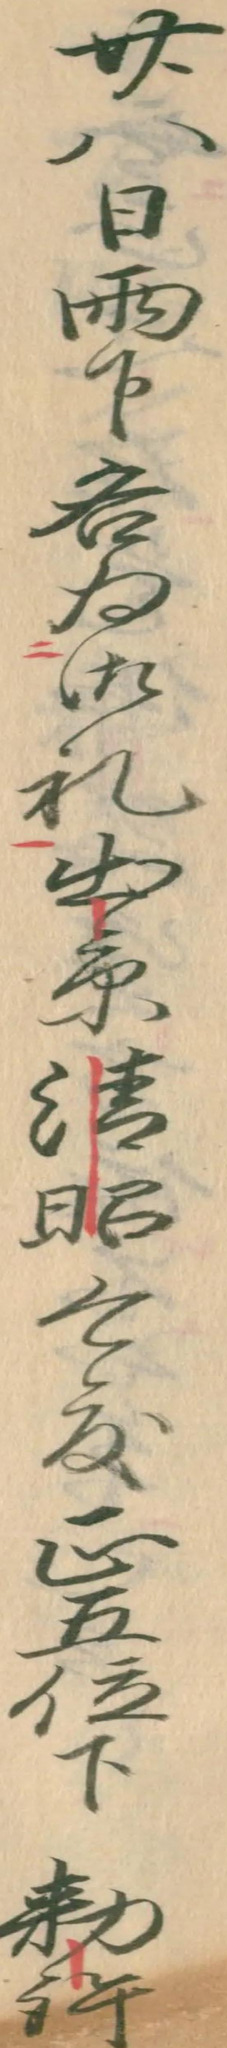廿八日雨下各為御礼出-京清昭今度正五位下勅-許
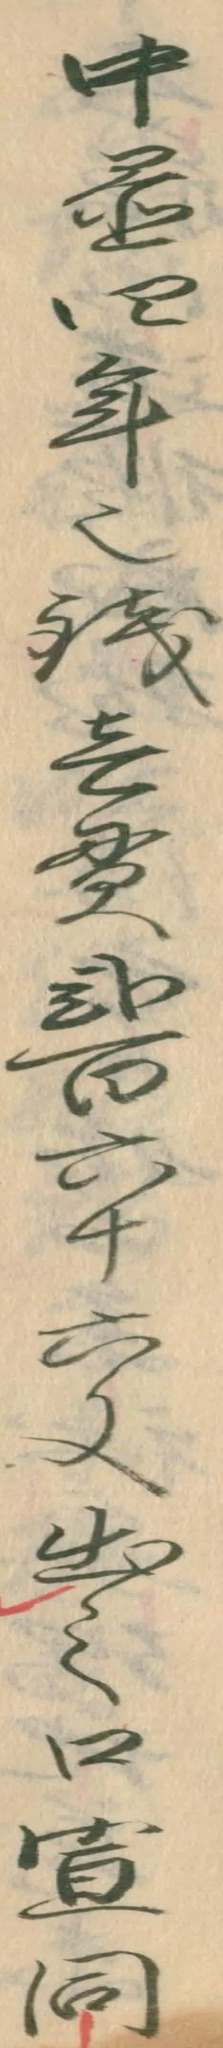中置四年也銭壱貫弐百六十六文出之口宣同-
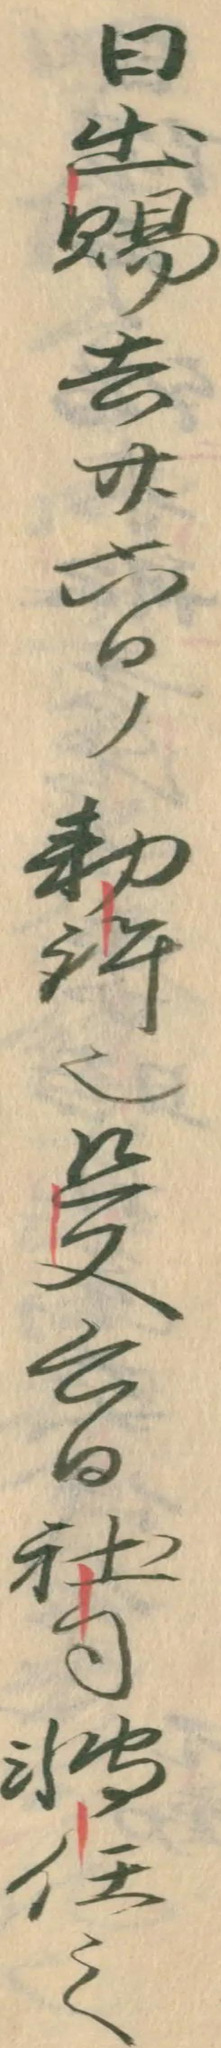日出_賜去廿六日ノ勅-許也且_又今日社-司転-任之
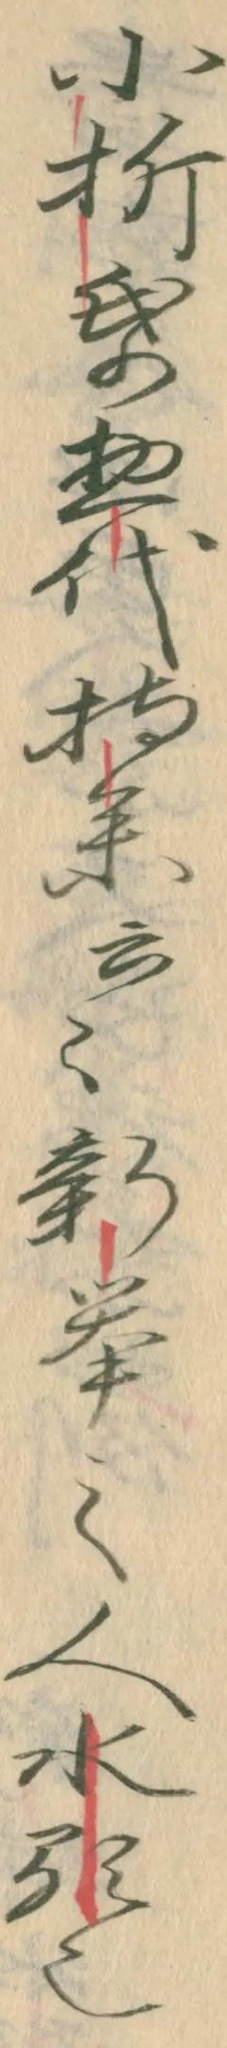小_折_帋惣-代持-参云々新-挙之人水顕也
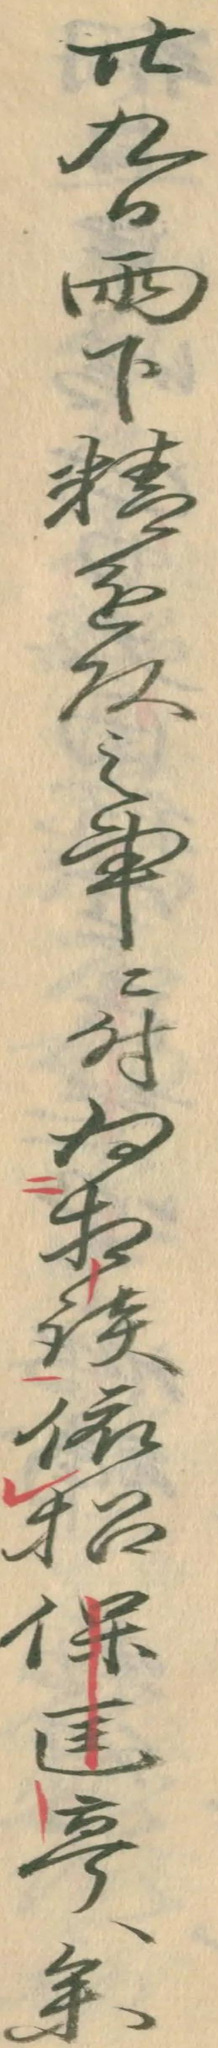廿九日雨下精進頭之事ニ付為相-談依招保匡_亭へ参
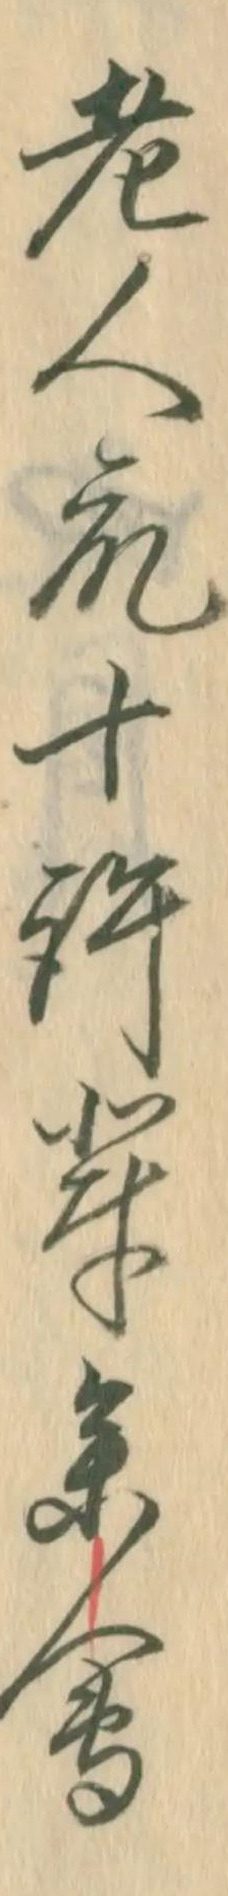老人衆十許輩参-会

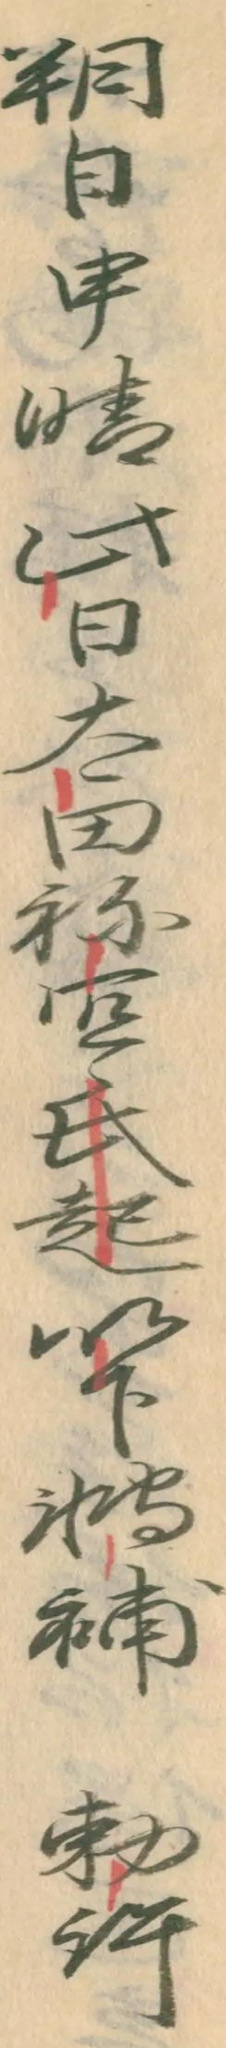朔日申晴此_日太_田祢-宜氏起以-下転-補勅-許
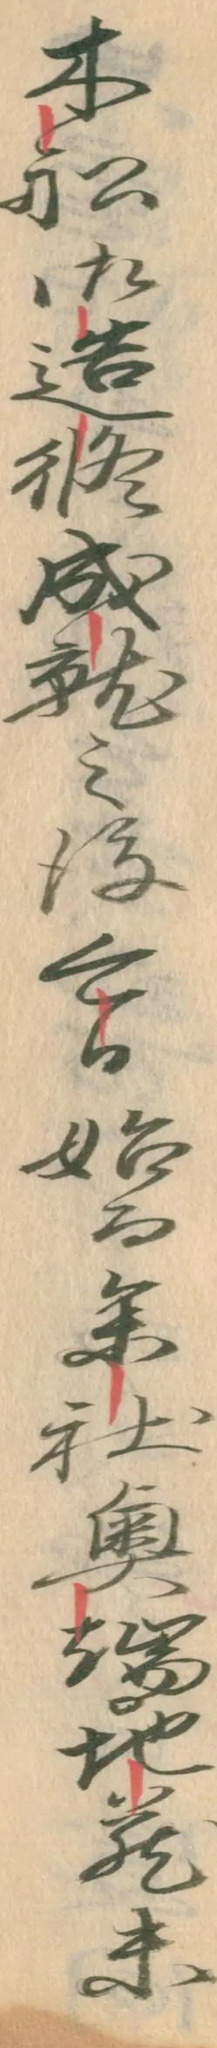木_船御-造-修成-就之後今-日始而参-社奥_端地-蔵未
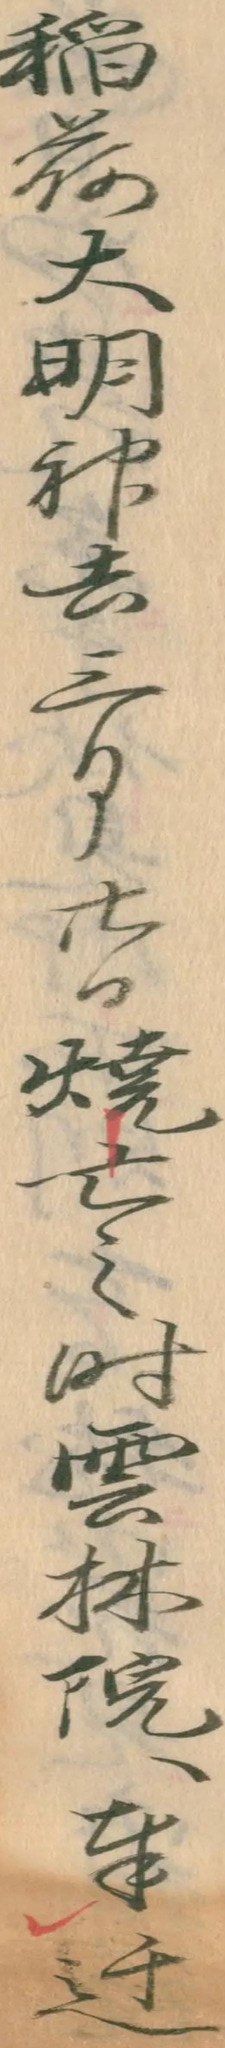稲荷大明神去三月廿日焼-亡之時雲林院へ奉迁
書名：賀茂社記録. 第16冊
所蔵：国立国会図書館 National Diet Library, JAPAN
